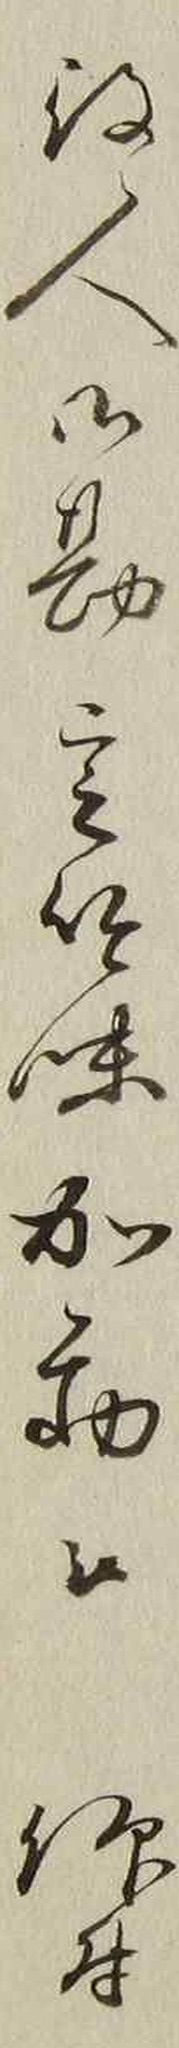役人御勘定吟味加勤被仰付
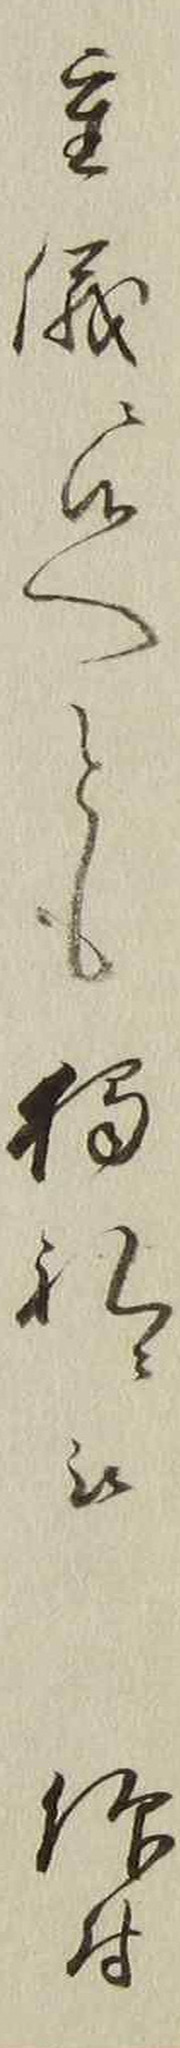重儀ニ候へとも独礼ニ被仰付
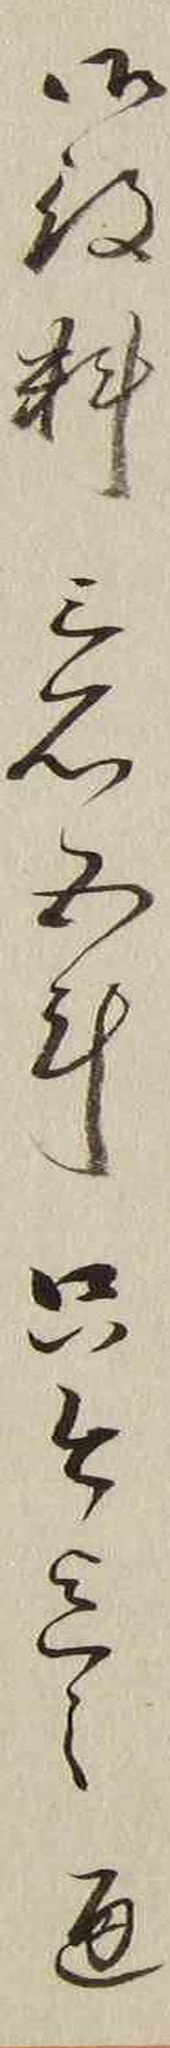御役料三石五斗只今迄之通
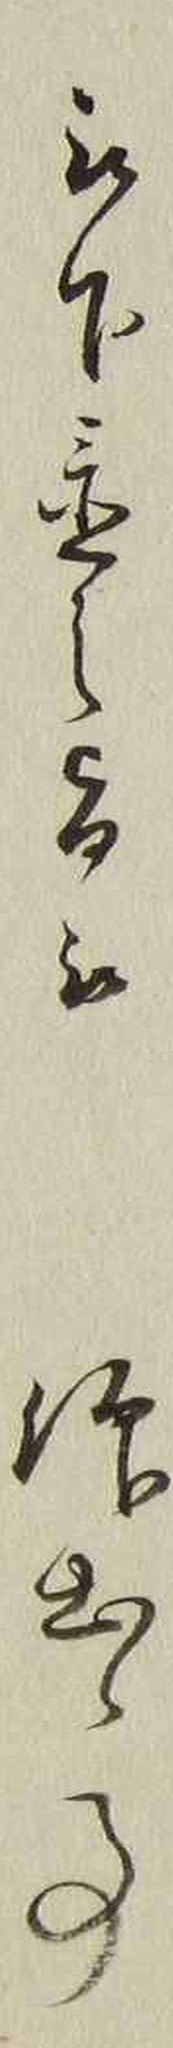被下置之旨被仰出候事
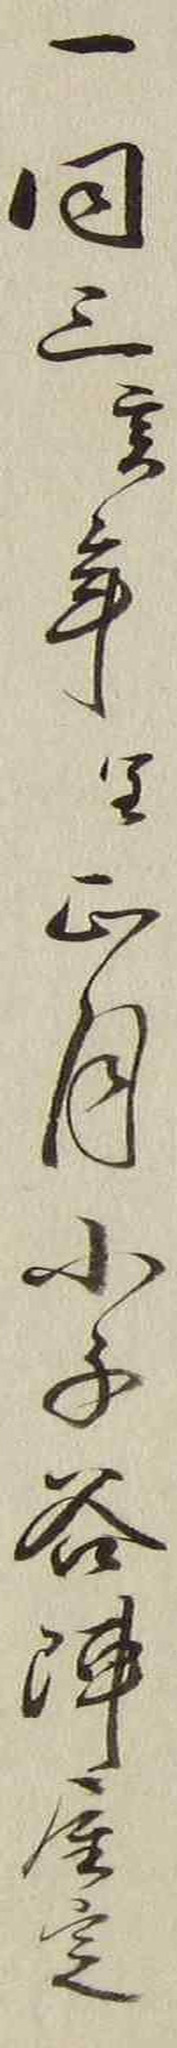一同三亥年閏正月小千谷陣屋定

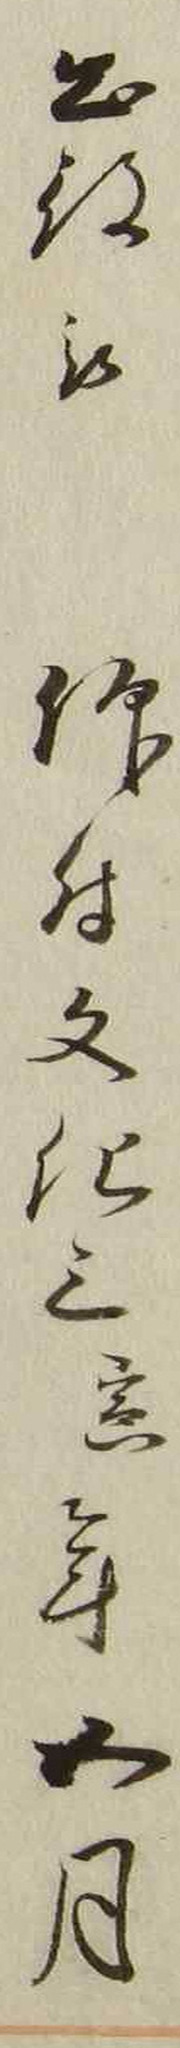出役被仰付文化三寅年五月
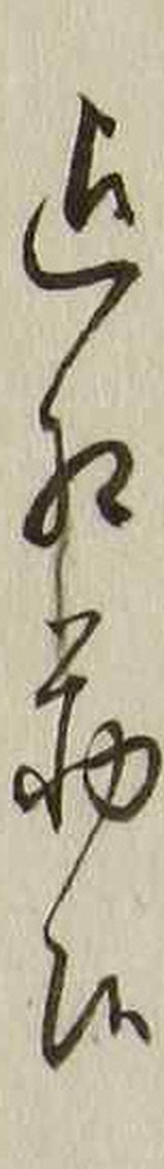迄相勤候
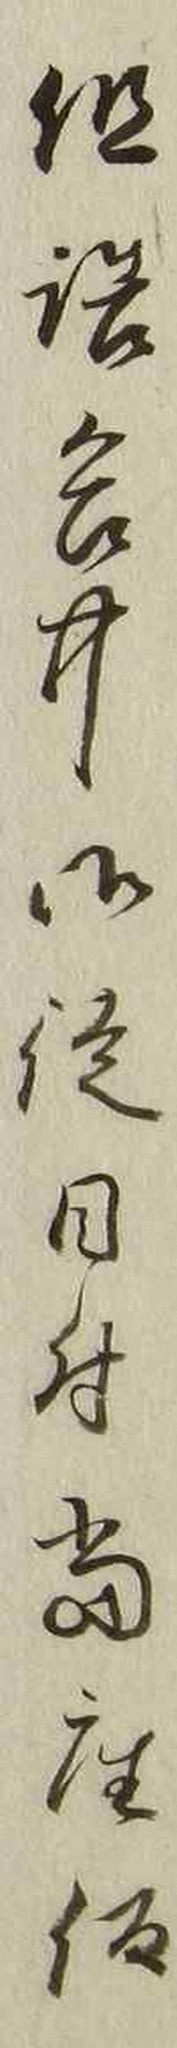但詰合中御徒目付当座仮
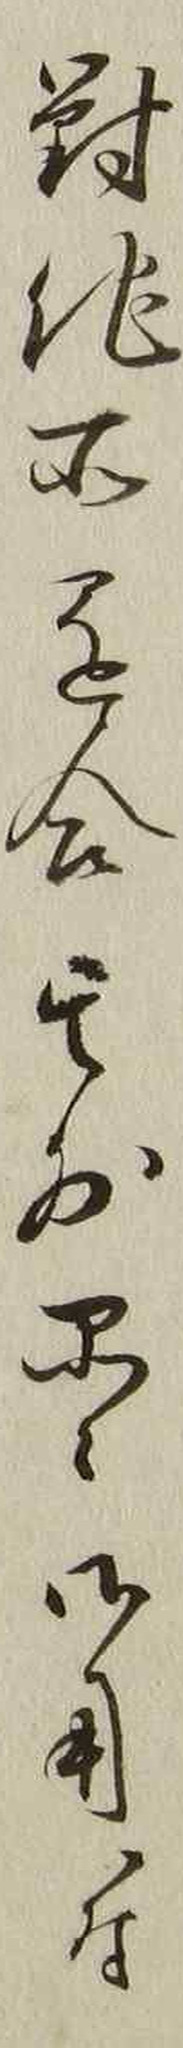対他所懸合其外品々御用ニ付
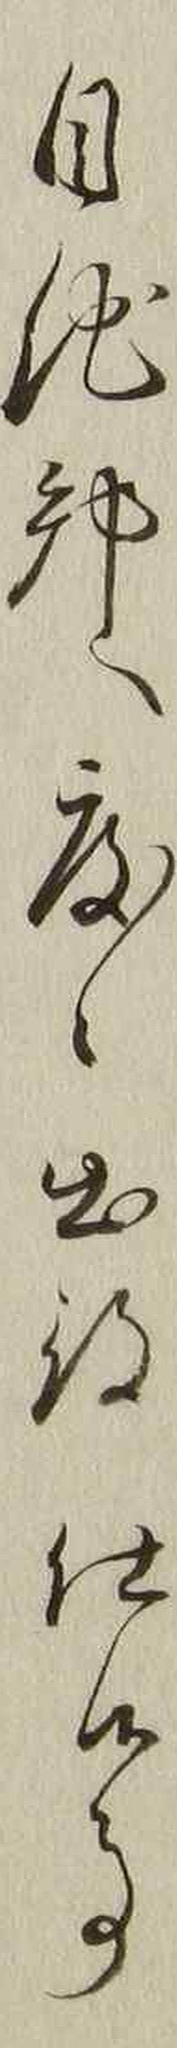自他邦へ度々出役仕候事
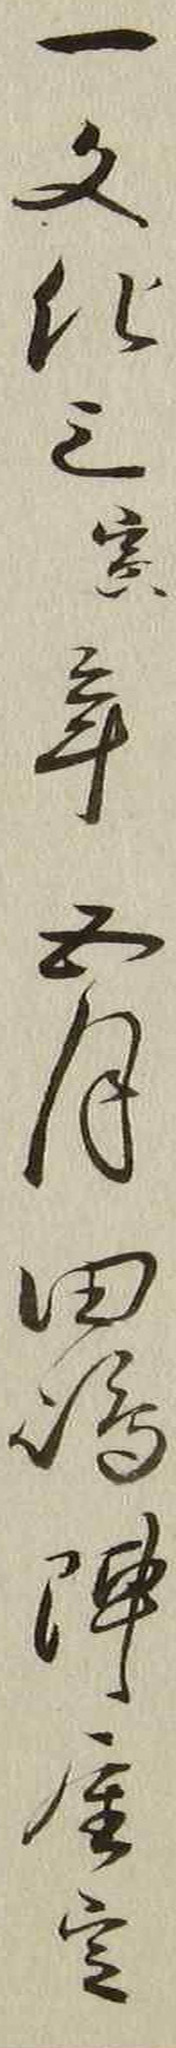一文化三寅年五月田嶋陣屋定
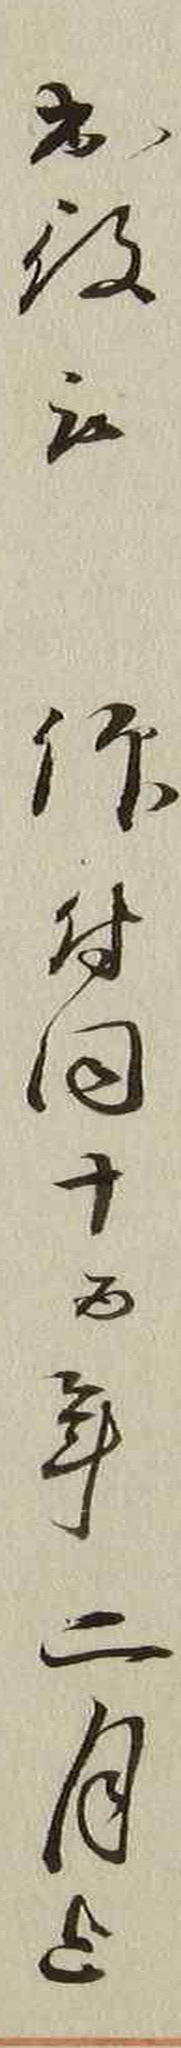出役被仰付同十酉年二月迄
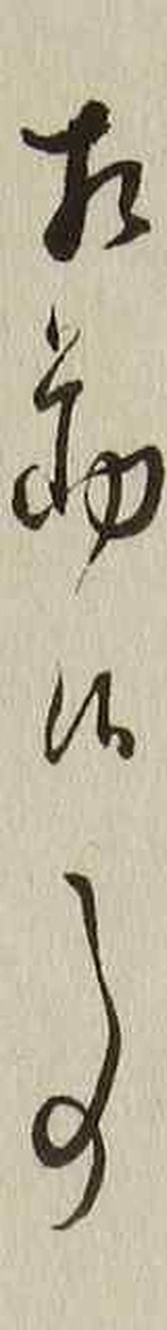相勤候事
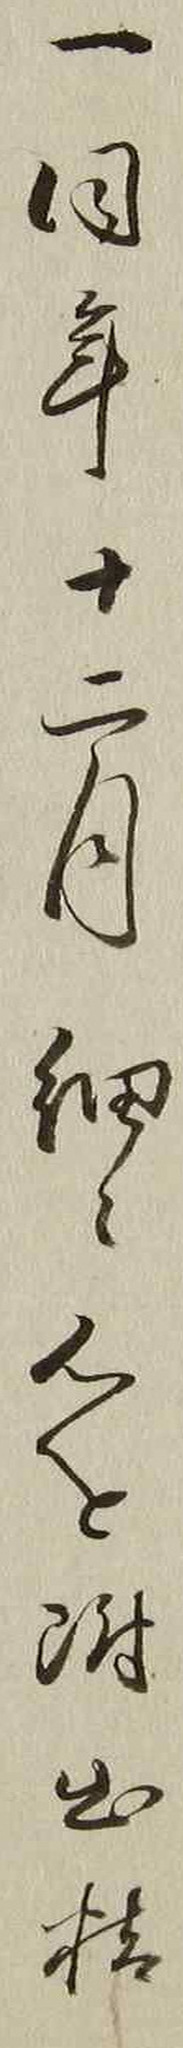一同年十二月細々心を附出精
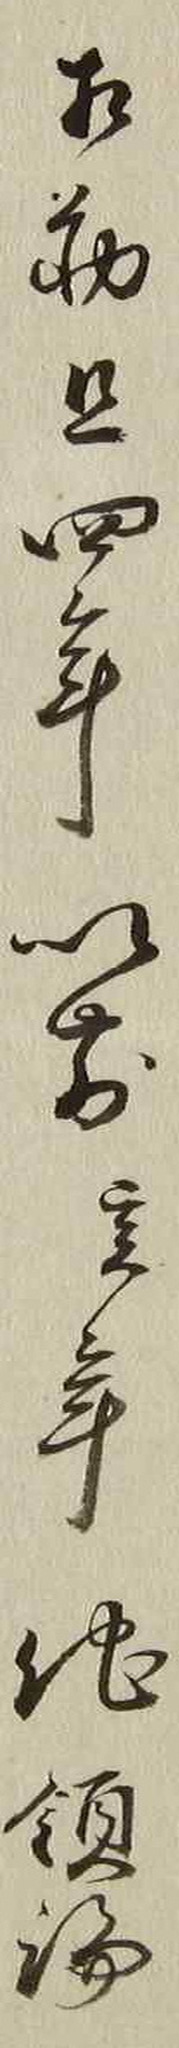相勤且四年以前亥年他領論
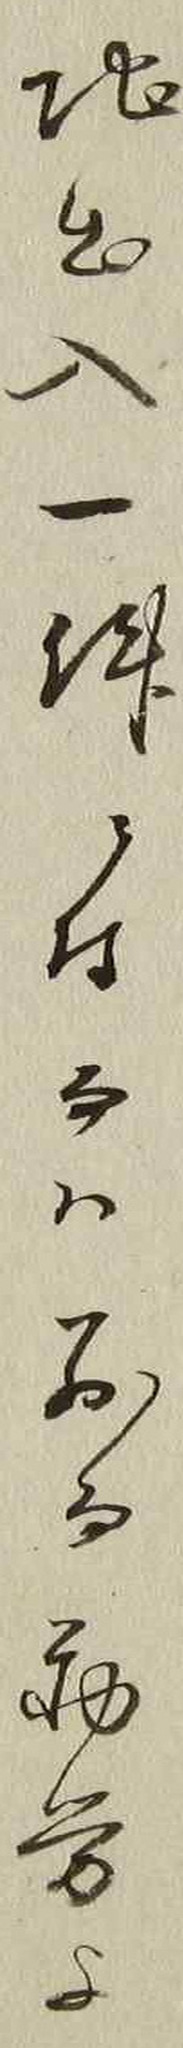地出入一件ニ付而ハ別而勤労よ
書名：諸士系譜　巻之52　に之部3
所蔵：会津若松市立会津図書館
